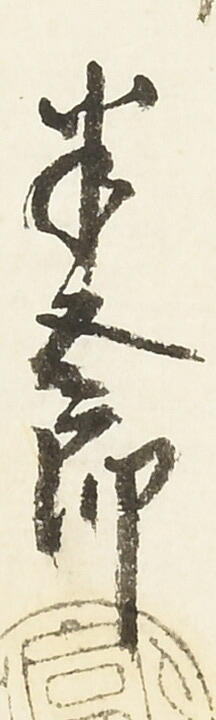半五郎
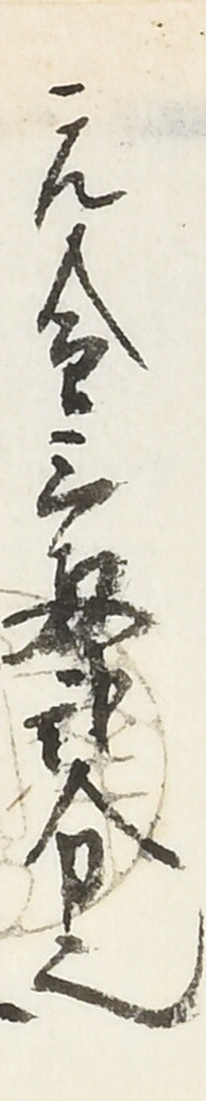元金三両弐分也
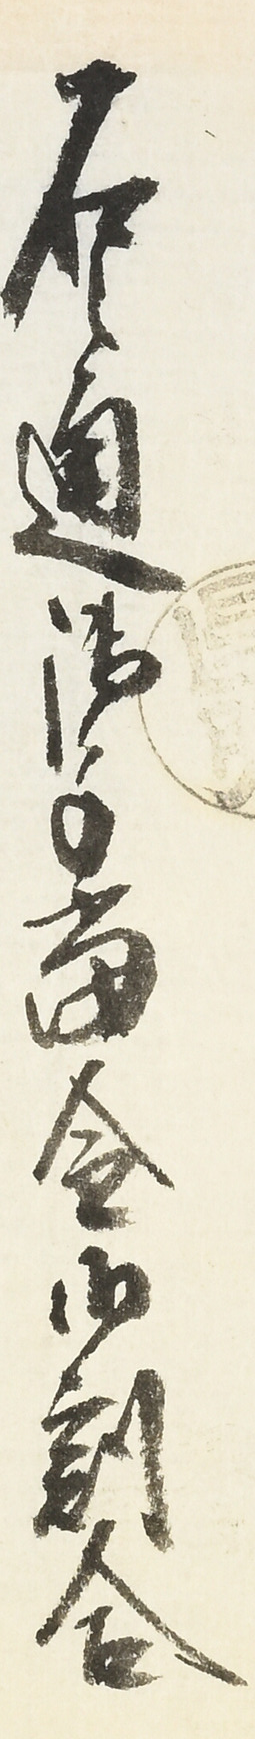右之通御手当金御割合
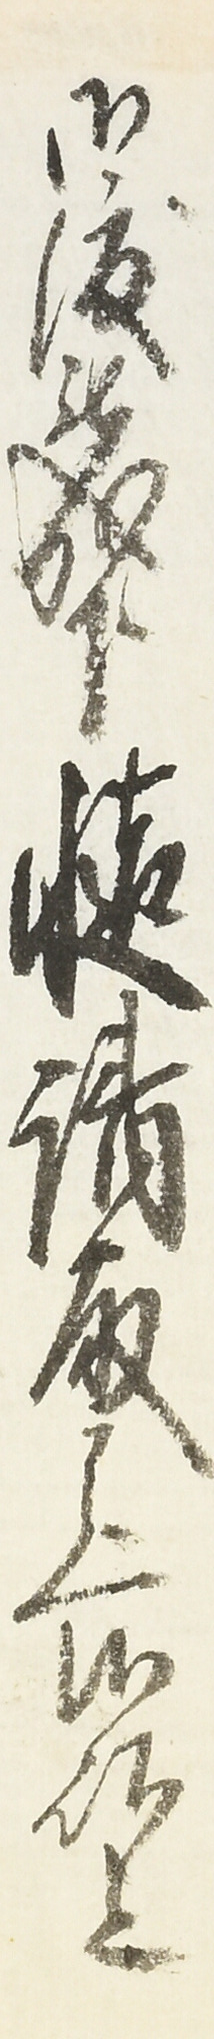御渡被成下慥請取申上候以上
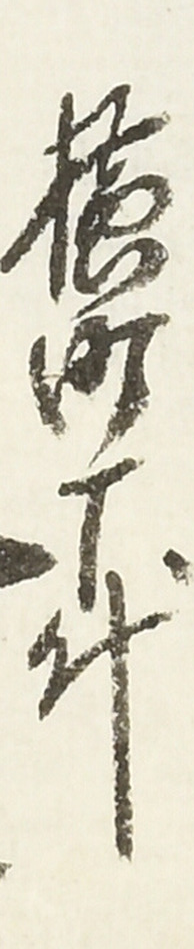横町丁代
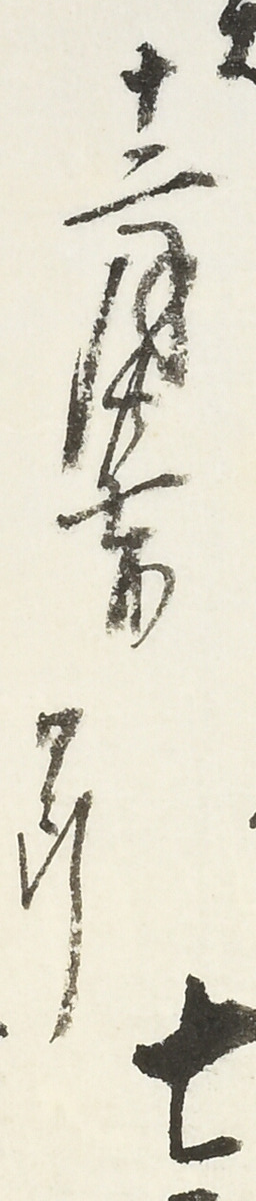十二月廿七日同断

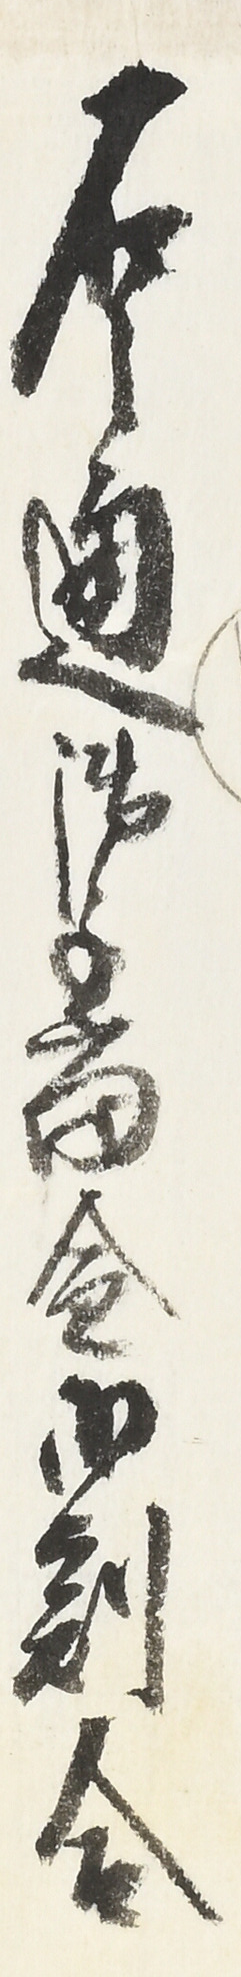右之通御手当金御割合
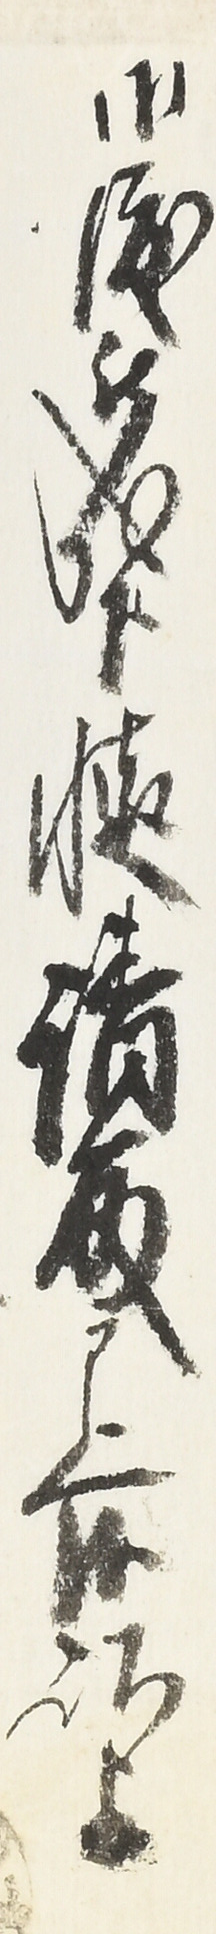御渡被成下慥請取申上候以上
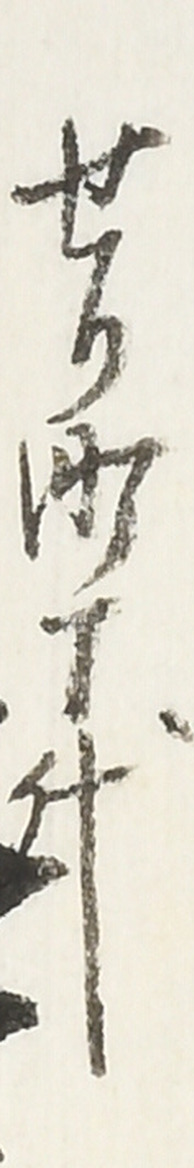せり町丁代
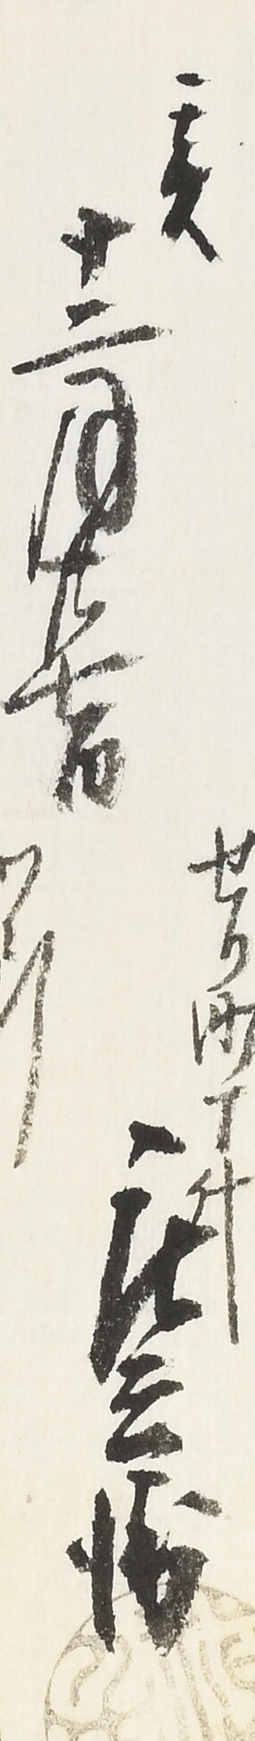十二月廿七日儀兵衛
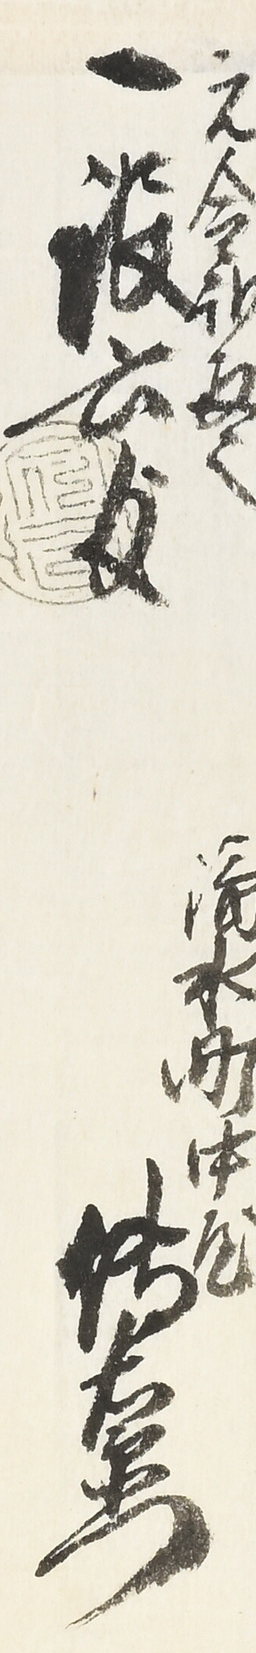一銀六匁伝右衛門
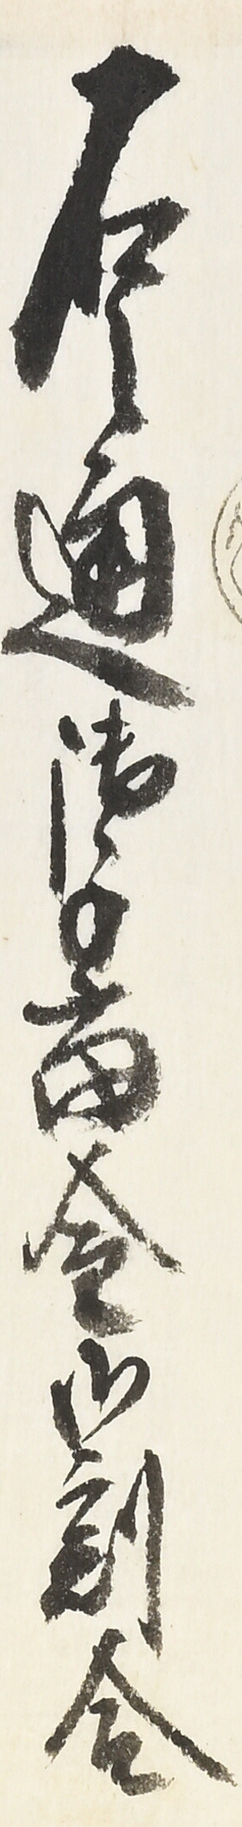右之通御手当金御割合
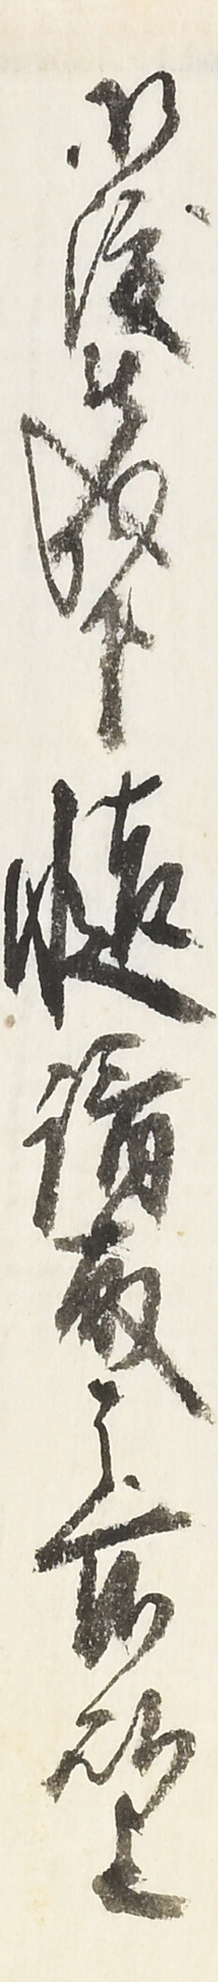御渡被成下慥請取申上候以上
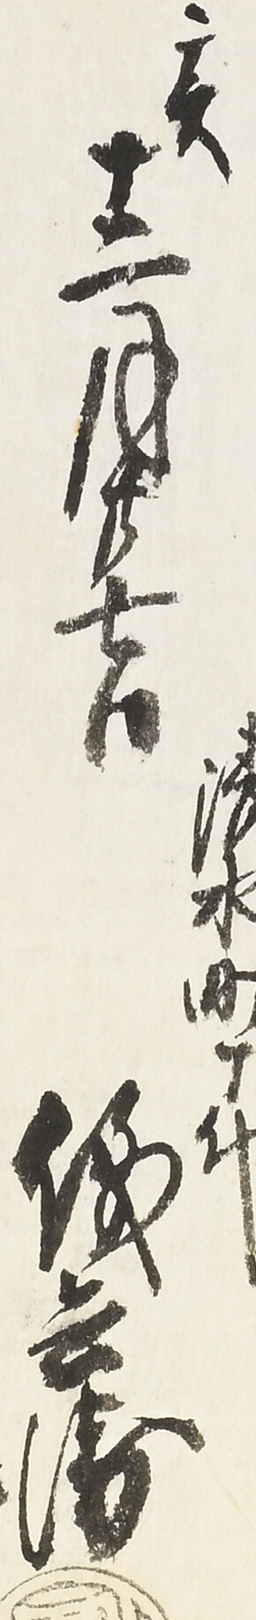十二月廿七日儀兵衛
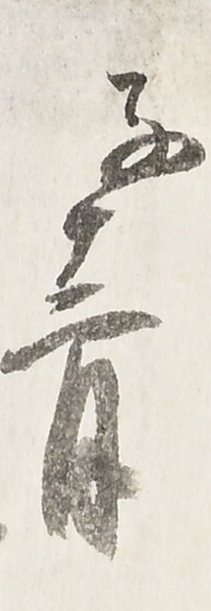子十二月
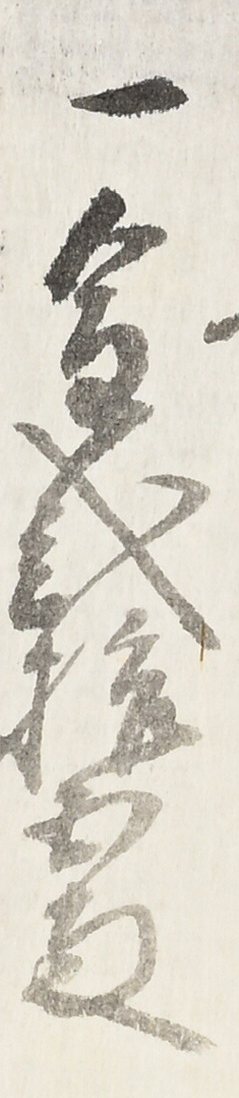一金弐拾五両
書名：御才覚金御利足割渡扣帳
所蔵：伊那市立高遠町図書館・合同会社AMANE
